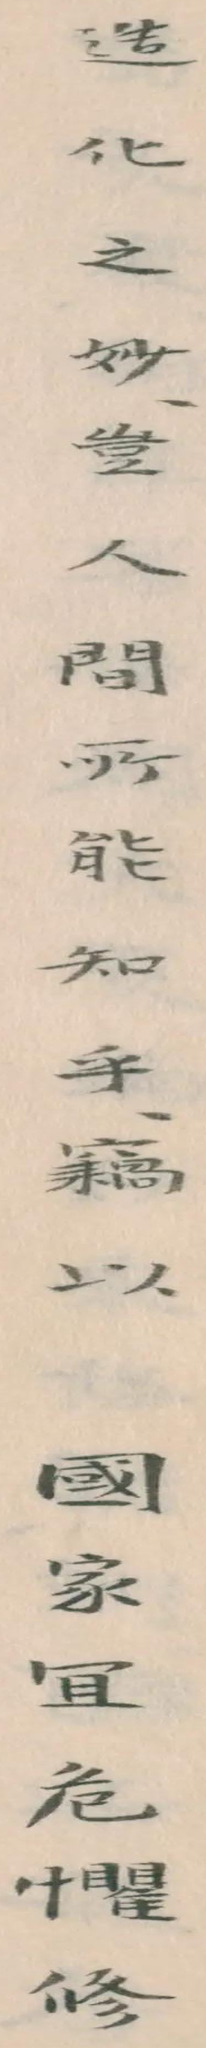造化之妙、豈人間所能知乎、窃以国家宜危懼修
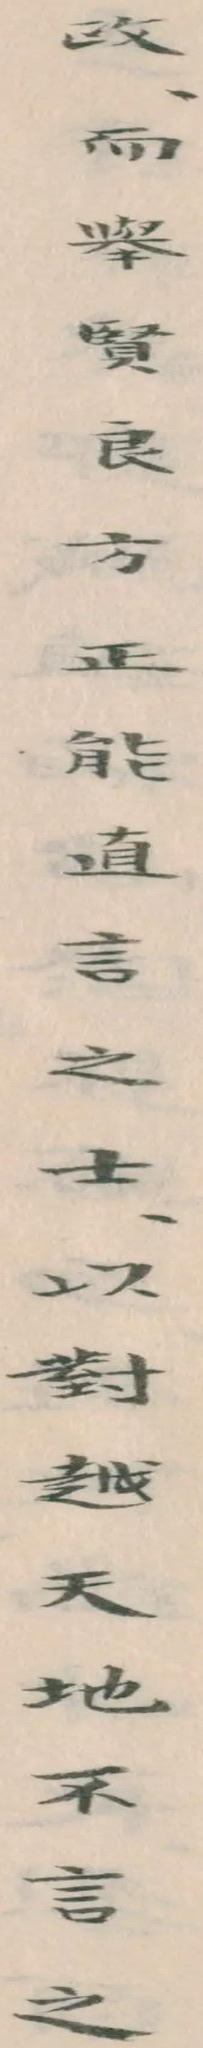政、而挙賢良方正能直言之士、以対越天地不言之
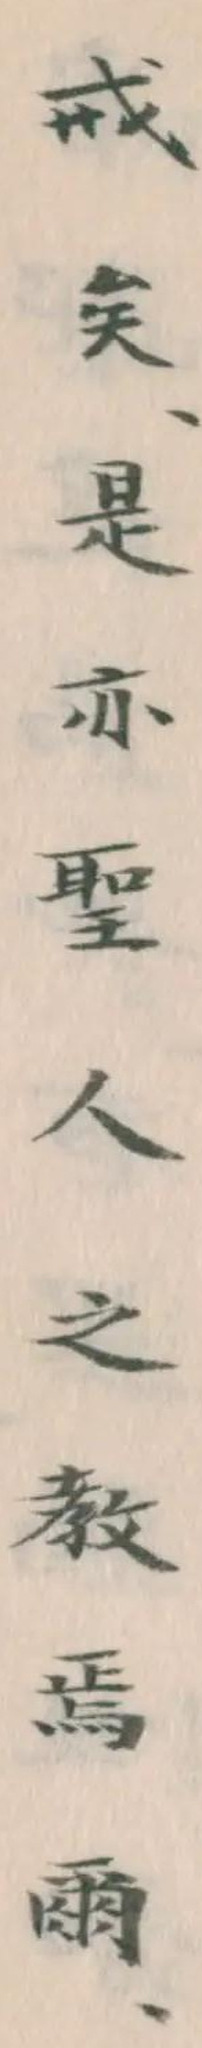戒矣、是亦聖人之教焉尓、
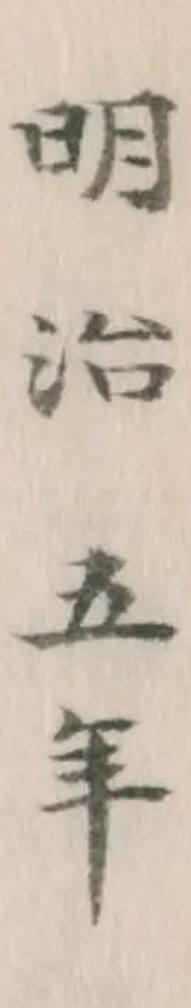明治五年
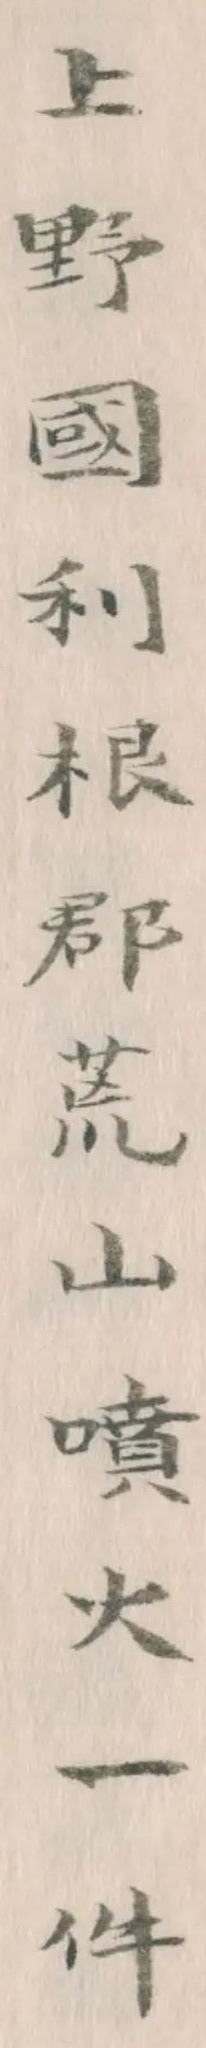上野国利根郡荒山噴火一件
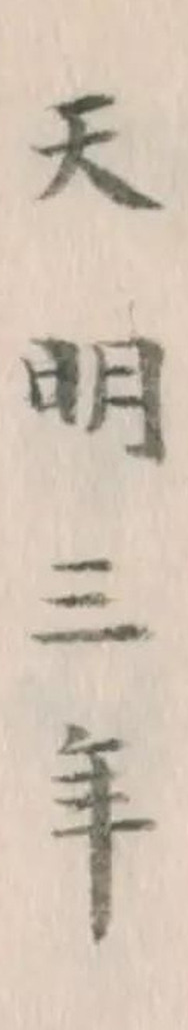天明三年
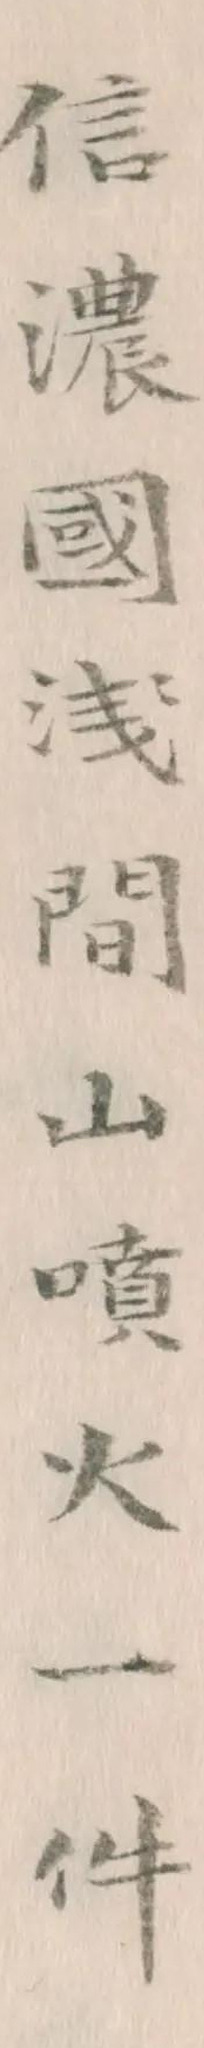信濃国浅間山噴火一件

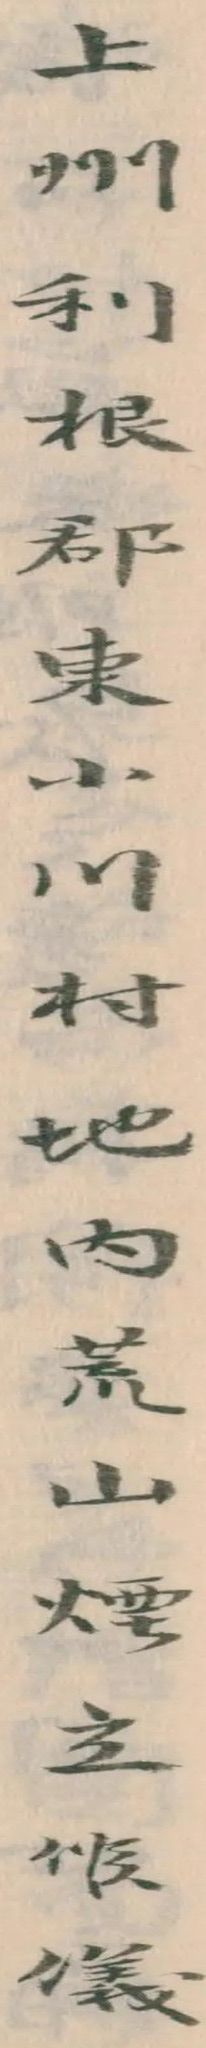上州利根郡東小川村地内荒山煙立候儀
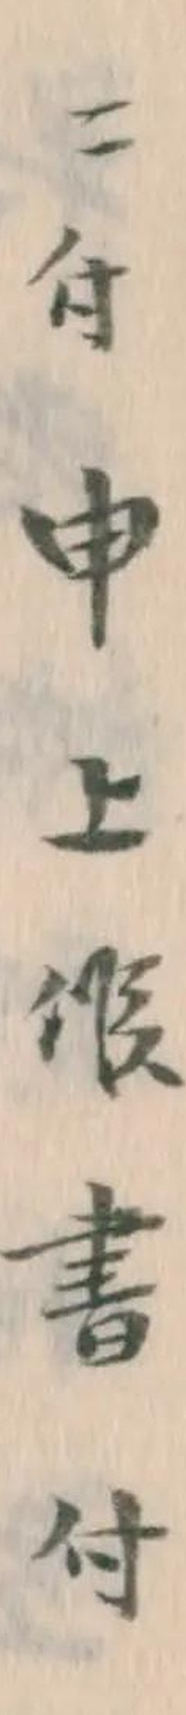ニ付申上候書付
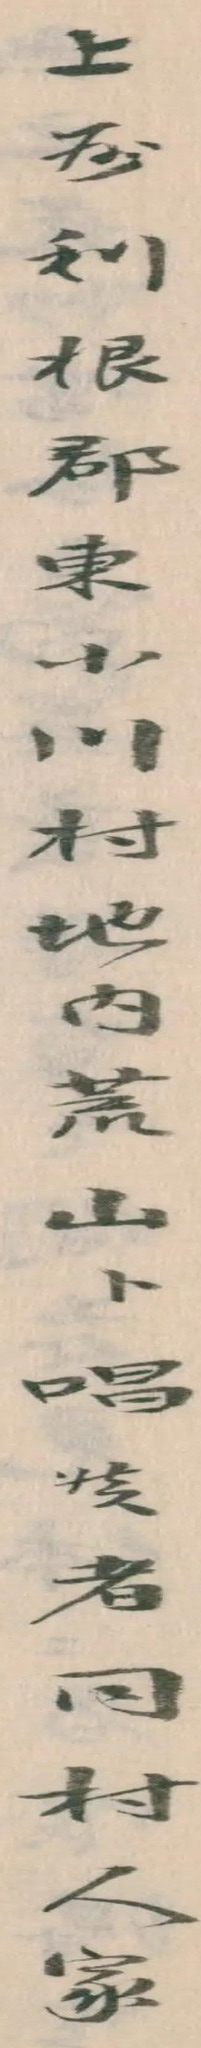上州利根郡東小川村地内荒山唱候者同村人家
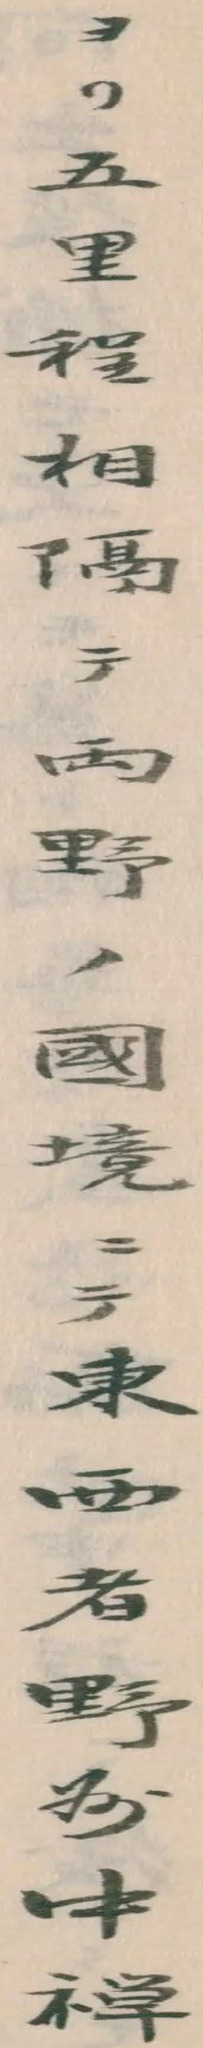ヨリ五里程相隔テ両野ノ国境ニテ東西者野州中禅
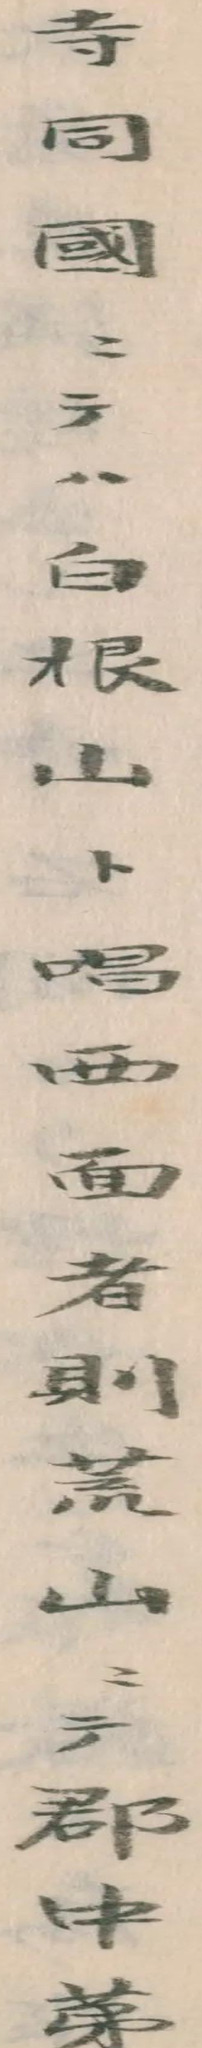寺同国ニテハ白根山ト唱西面者則荒山ニテ郡中第
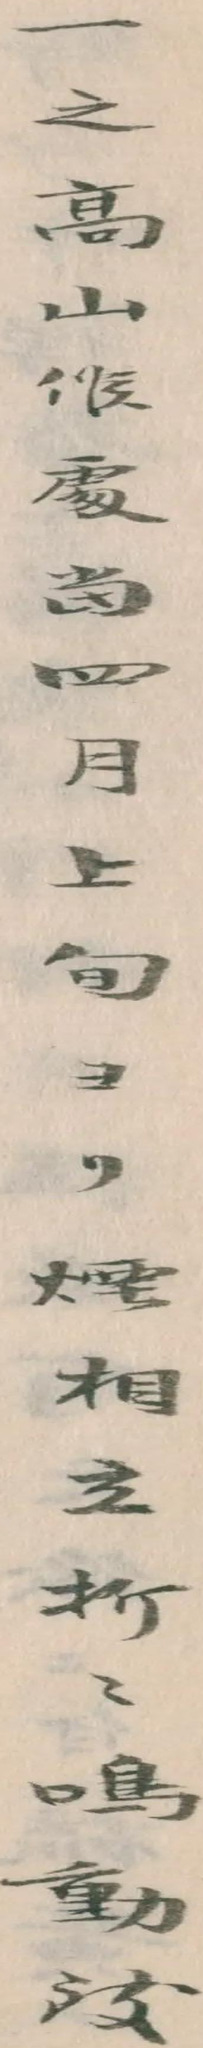一之高山候処当四月上旬ヨリ煙相立折々鳴動致
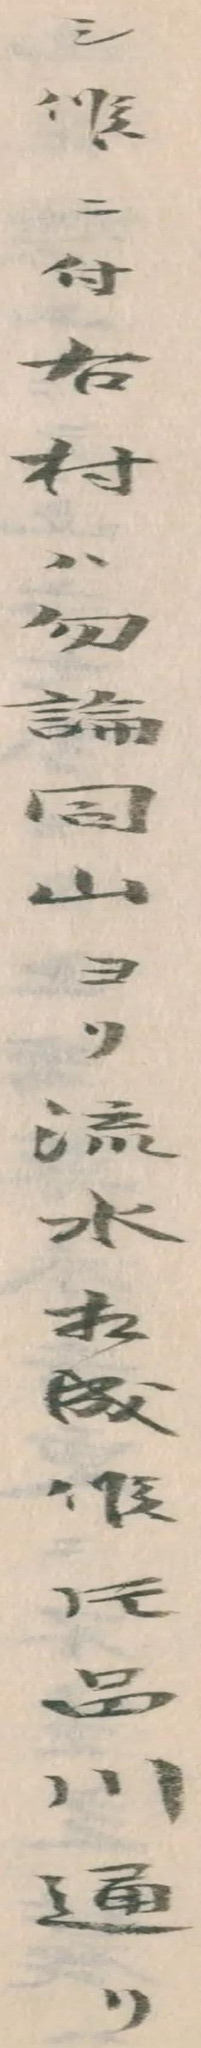シ候ニ付右村ハ勿論同山ヨリ流水相成候トモ品川通リ
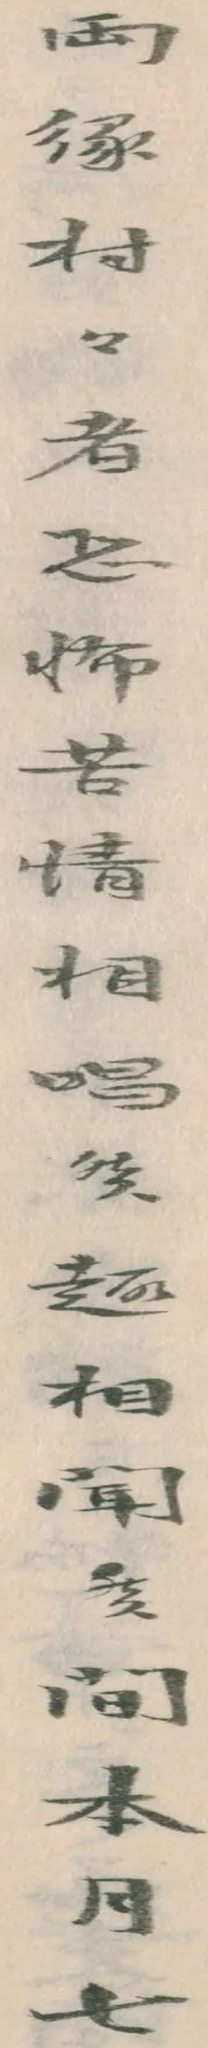両縁村々者恐怖苦情相唱候趣相聞候間本月七
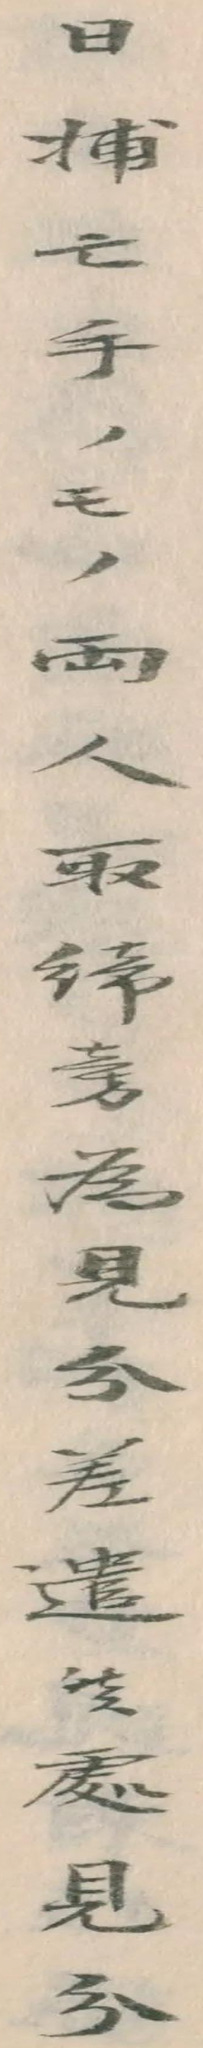日捕亡手ノモノ両人取締旁為見分差遣候処見分
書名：地災撮要. 巻11-12(地震之部)
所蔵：国立国会図書館 National Diet Library, JAPAN
